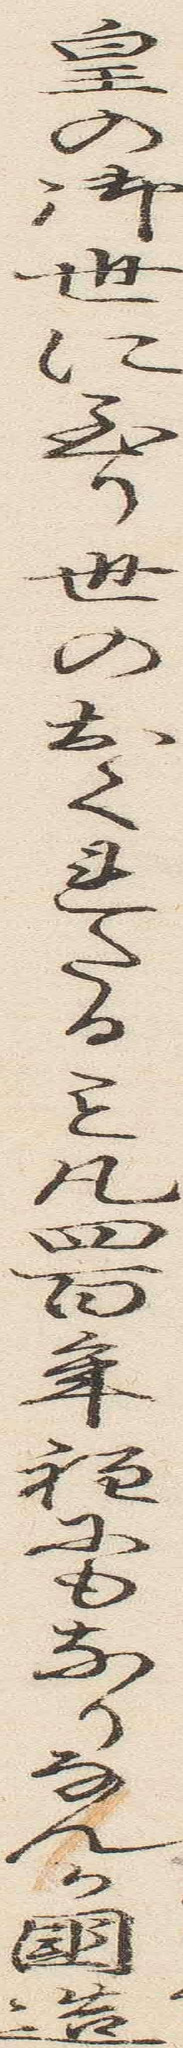皇の御世に至り世のおくれたること凡四百年程にもなりなんか國造
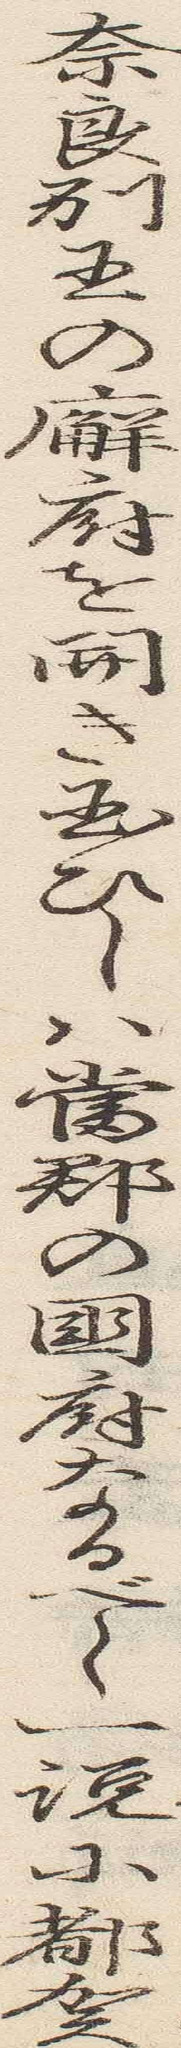奈良別王の廨府を開き玉ひしは當郡の國府なるべし一説に都賀
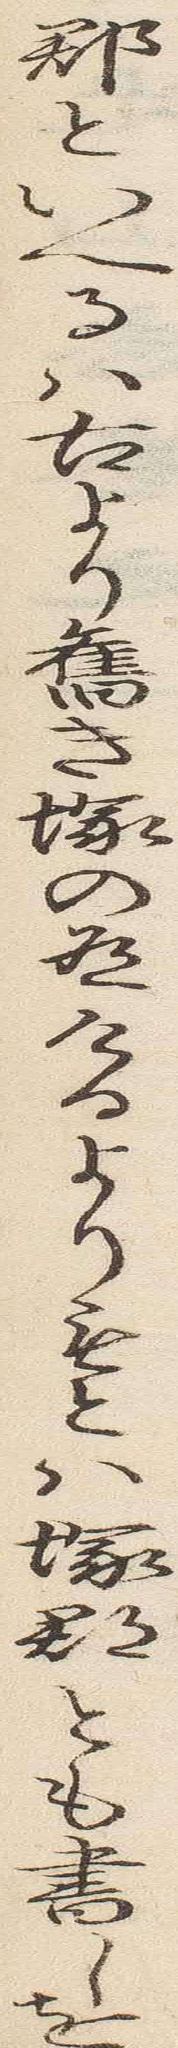郡といへるは古より𦾔き塚の有けるよりもとは塚郡とも書しを
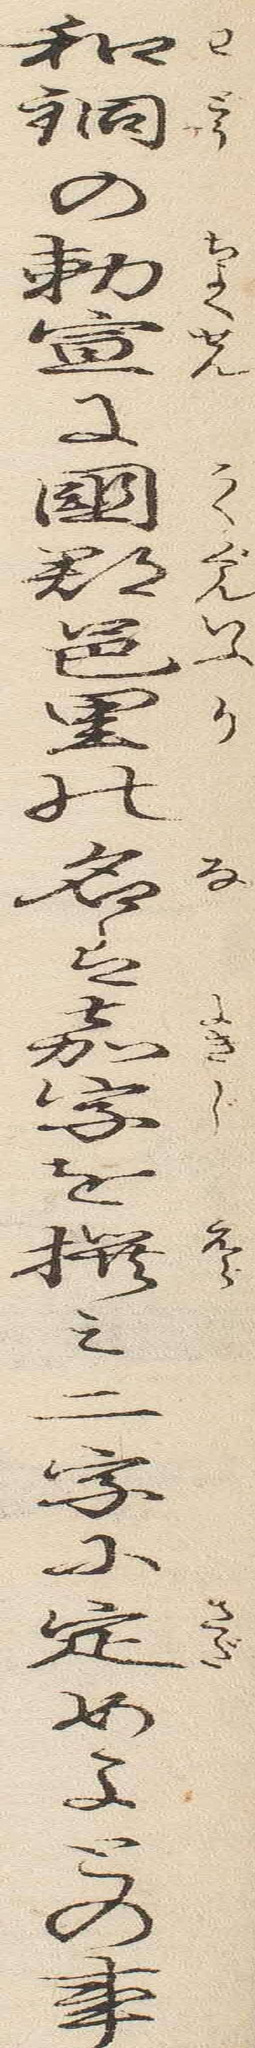和銅の勅宣に國郡邑里の名は嘉字を撰み二字に定めよとの事
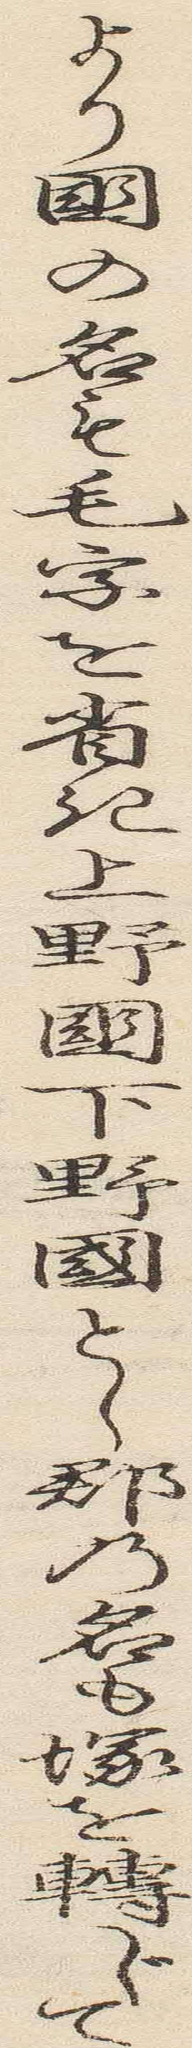より國の名も毛字を省き上野國下野國とし郡の名も塚を轉じて
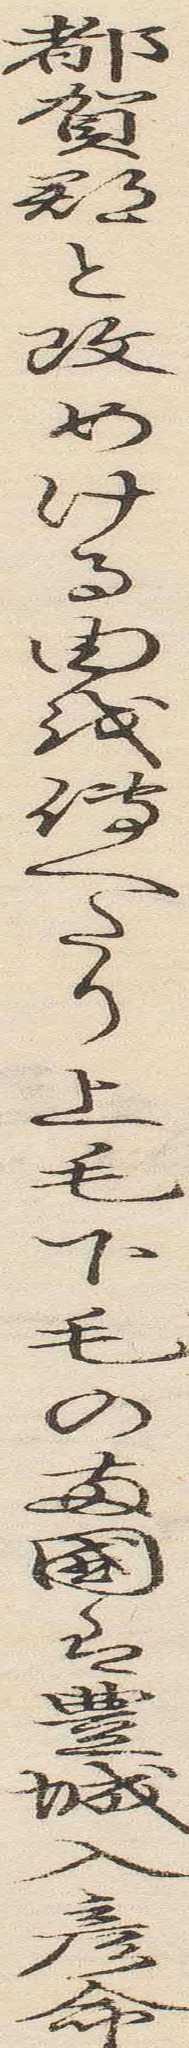都賀郡と改めける由を傳へたり上毛下毛の両國は豊城入彦命
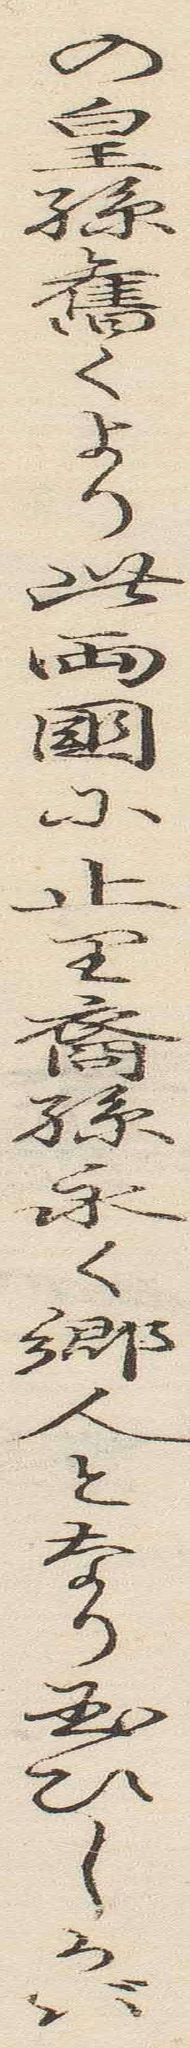の皇孫𦾔くより此両國に止り裔孫永く郷人となり玉ひしかば
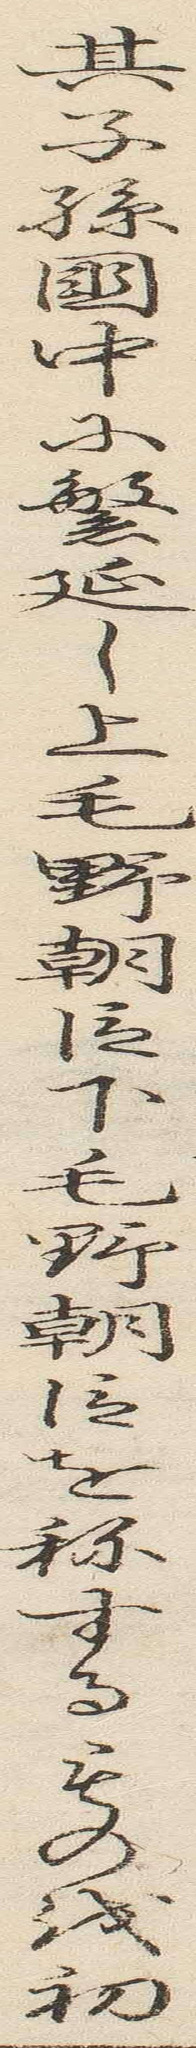其子孫國中に繁延し上毛野朝臣下毛野朝臣を称するものを初
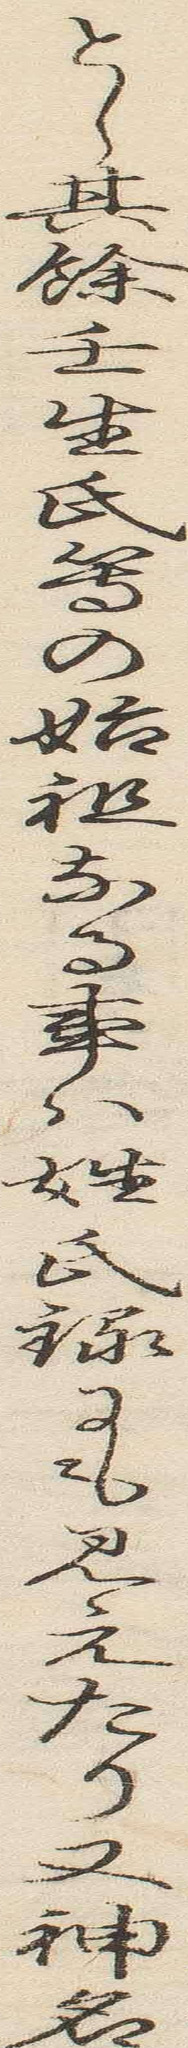とし其餘壬生氏等の始祖なる事は姓氏録にも見えたり又神名
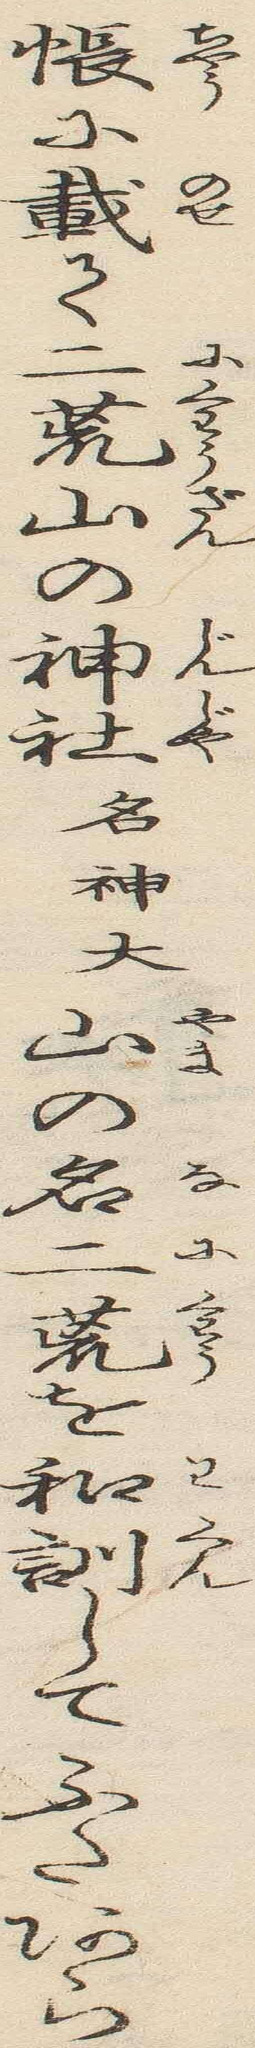帳に載て二荒山の神社名神大山の名二荒を和訓してふたあら
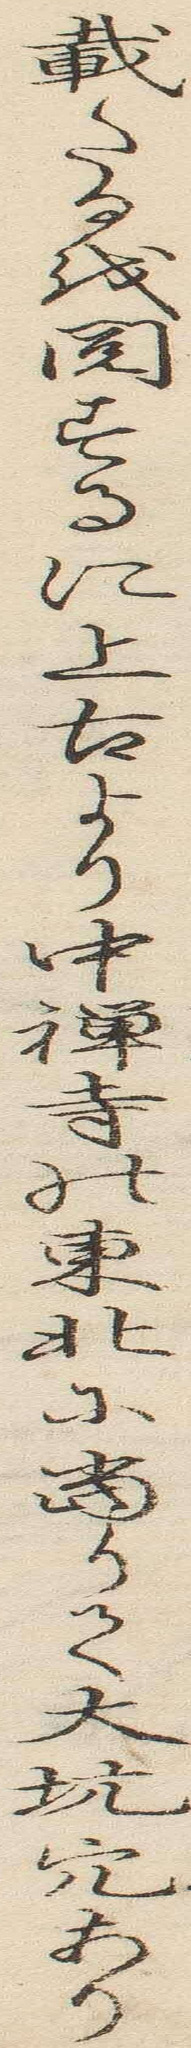載たるを閲するに上古より中禅寺の東北に當りて大坑穴あり
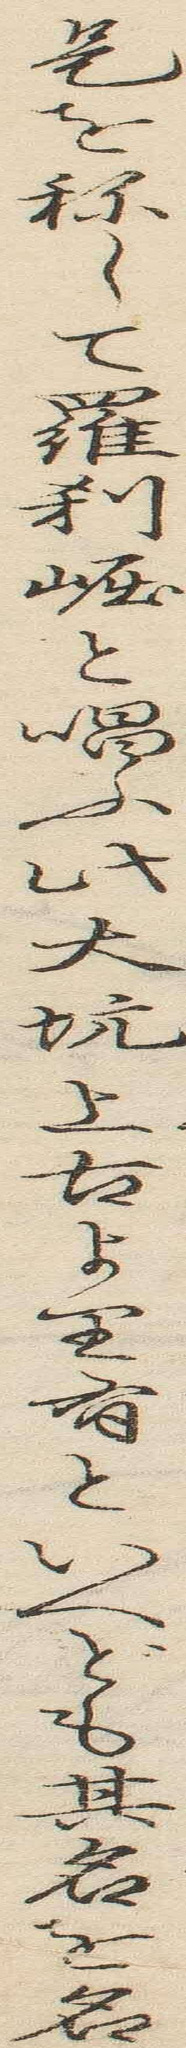是を称して羅刹崛と唱ふ此大坑上古より有といへども其名を名
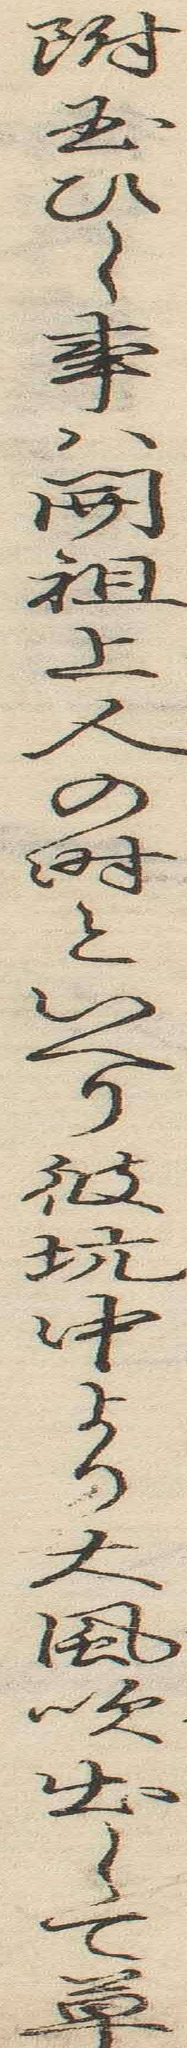附玉ひし事は開祖上人の时といへり彼坑中より大風吹出して草
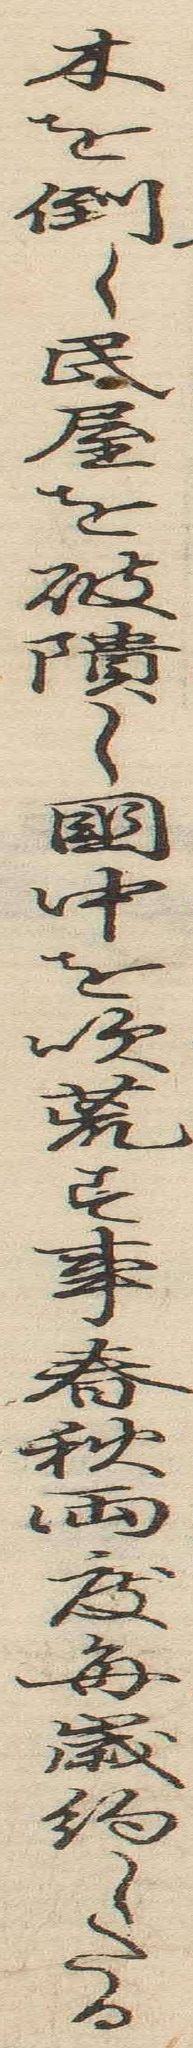木を倒し民屋を破潰し國中を吹荒す事春秋両度毎歳約したる

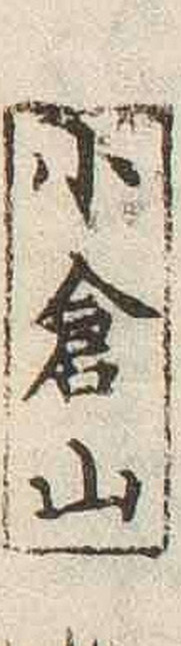小倉山
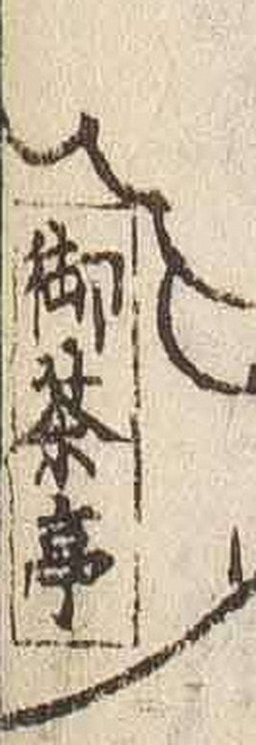御茶亭
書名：日光山志
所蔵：東京学芸大学附属図書館 国文学研究資料館
